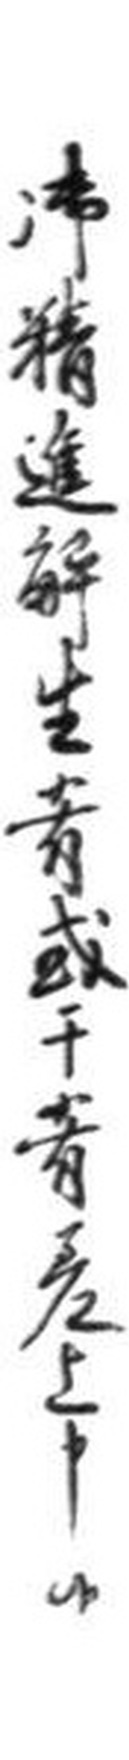御精進解生肴或干肴差上申候
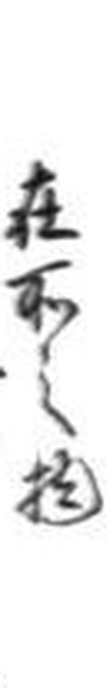在所之物
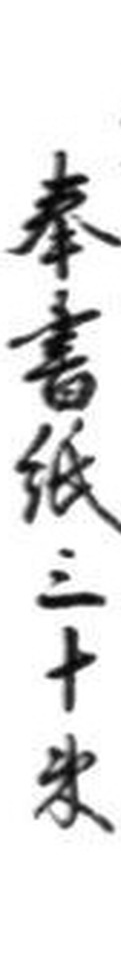奉書紙三十束
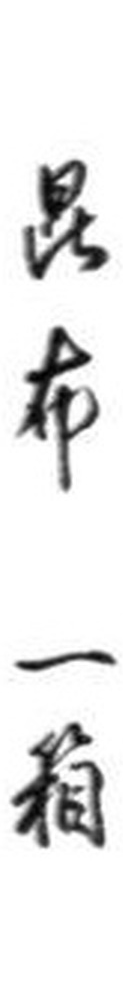昆布一箱
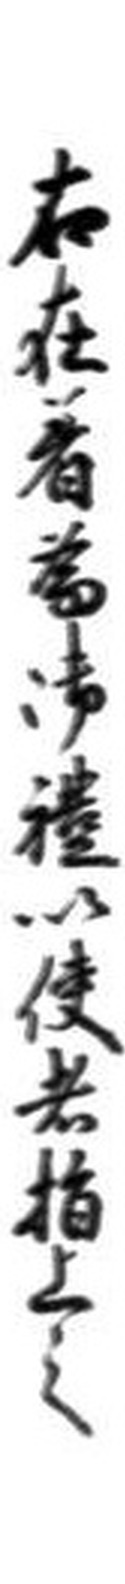右在着為御礼以使者指上之
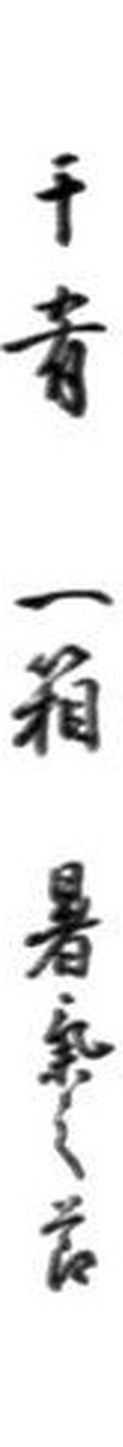干肴一箱暑気之節
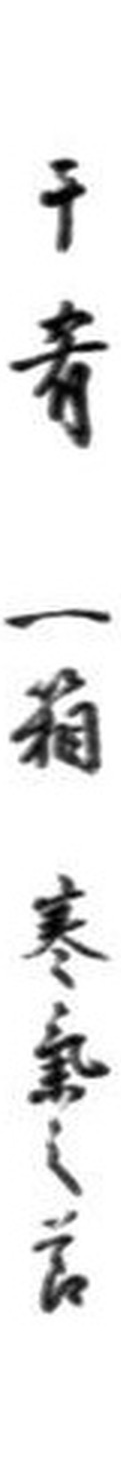干肴一箱暑気之節
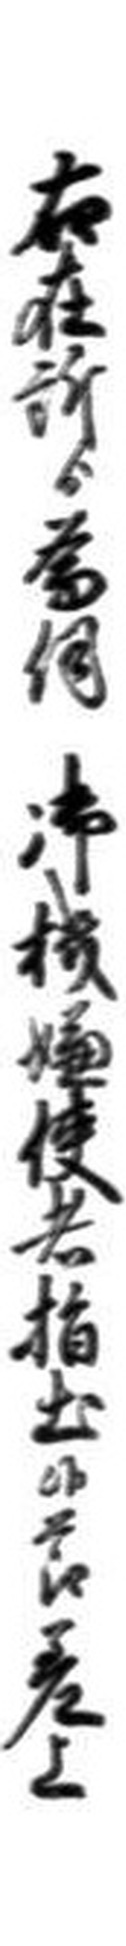右在所ゟ為伺御機嫌使者指出候節差上
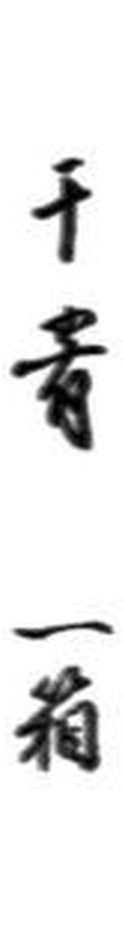干肴一箱
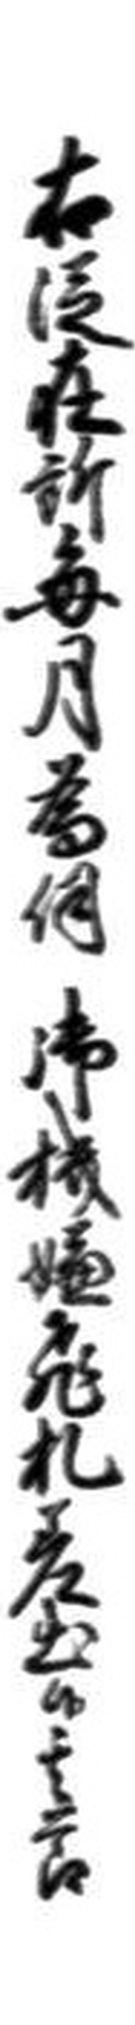右従在所毎月為伺御機嫌飛札差出候其節
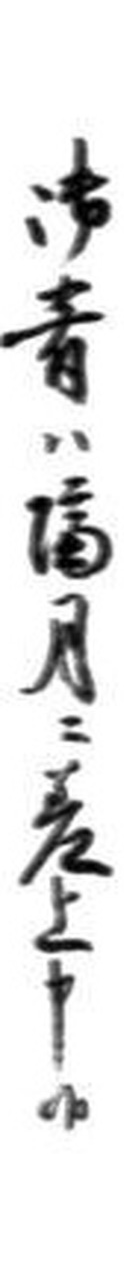御肴ハ隔月ニ差上申候

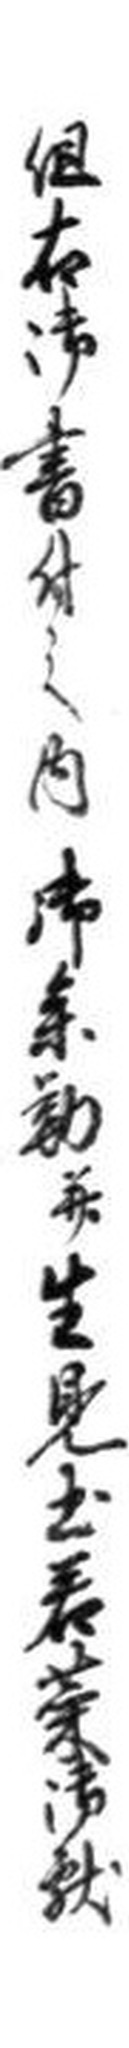但右御書付之内御参勤并生見玉若菜御献
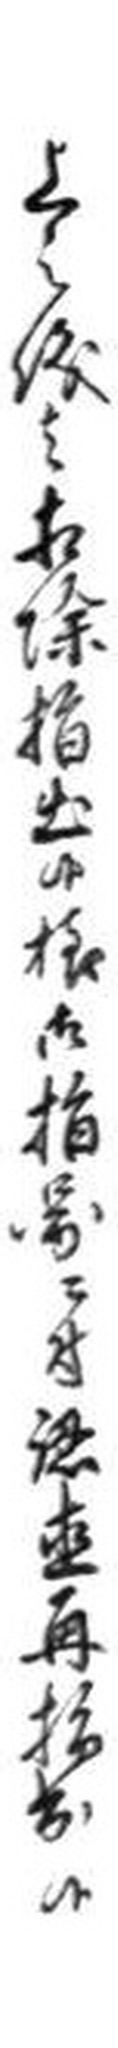上之儀者相除指出候様御指図ニ付認置再指出候
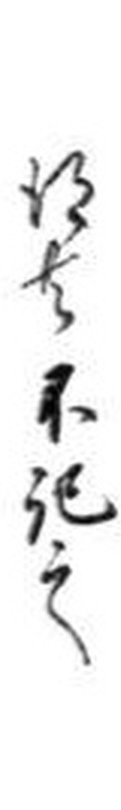得共不記之
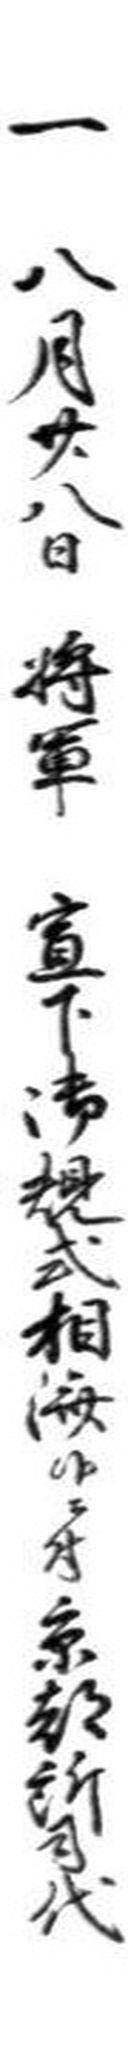一八月廿八日将軍宣下御規式相済候ニ付京都所司代
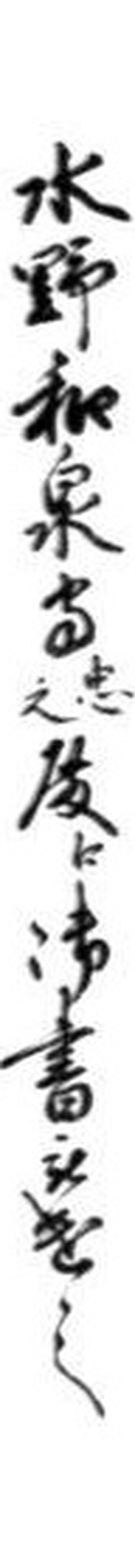水野和泉守忠之殿江御書被遣之
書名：家譜 三十一 吉邦公 享保元年
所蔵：福井県文書館 Fukui Prefectural Archives
